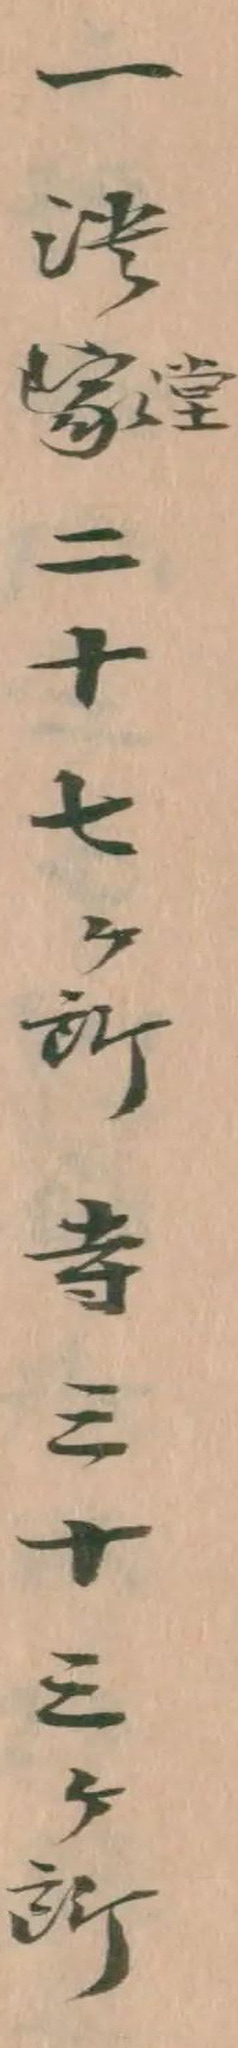一潰堂二十七ヶ所寺三十三ヶ所
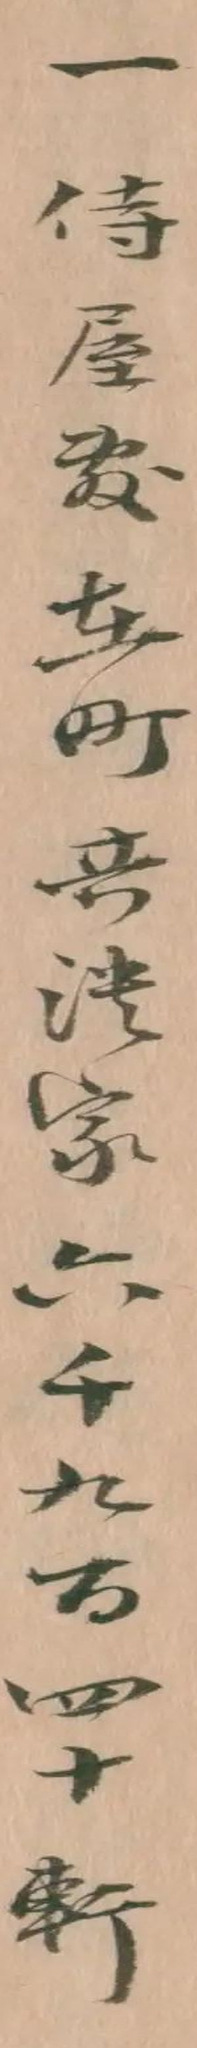一侍屋敷町在共潰家六千九百四十軒
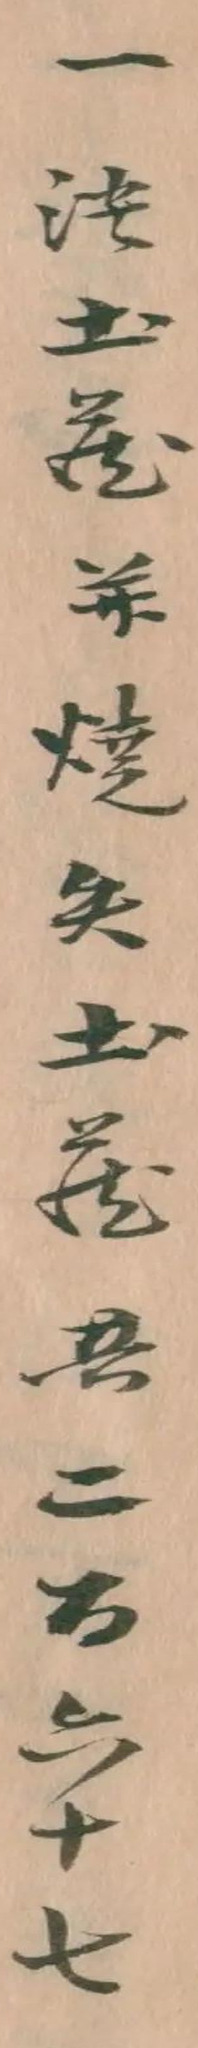一潰土蔵并焼失土蔵共二百六十七
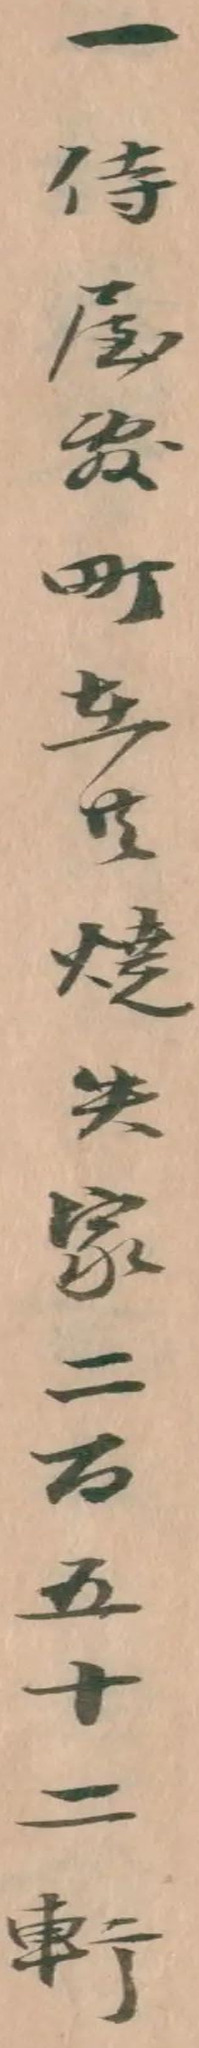一侍屋敷町在共焼失家弐百五十二軒
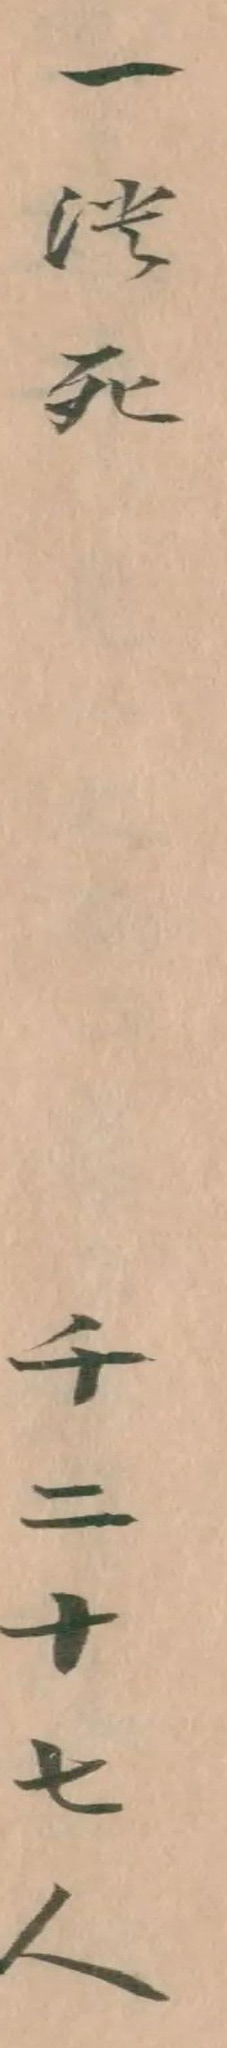一潰死千二十七人

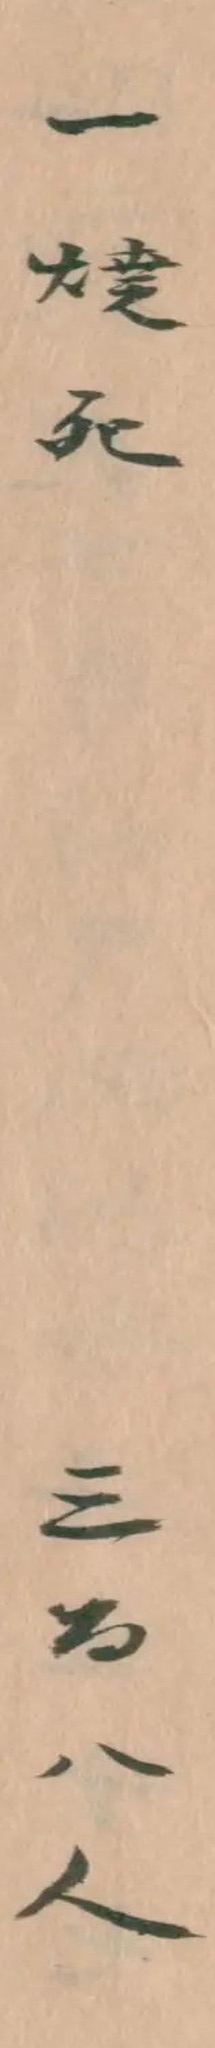一焼死三百八人
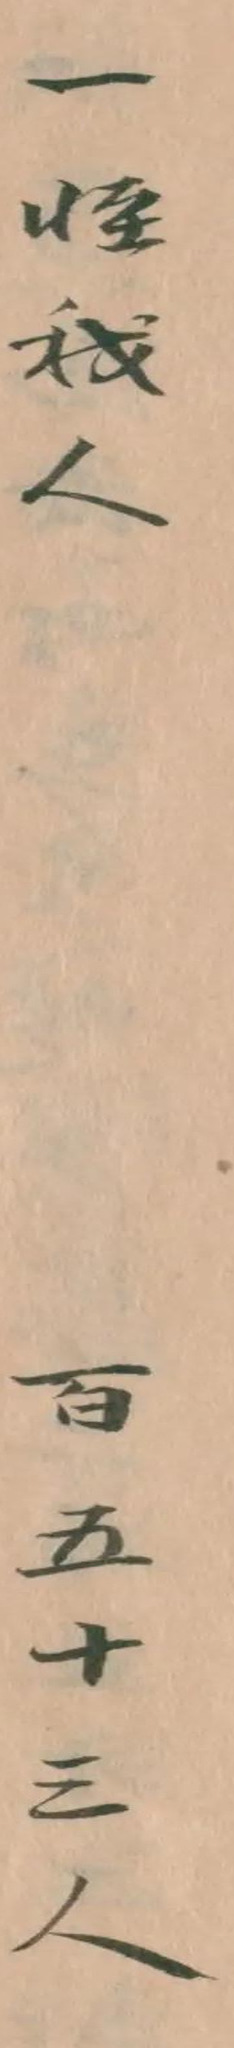一怪我人百五十二人
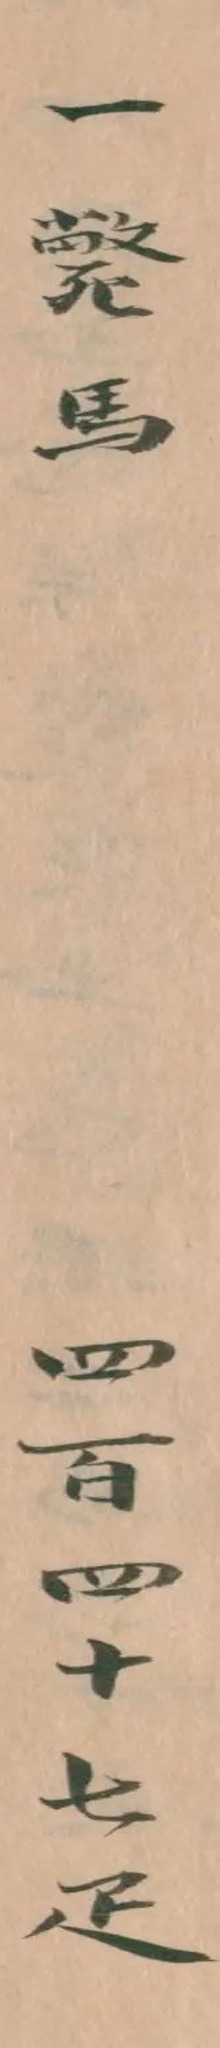一斃馬四百四十七疋
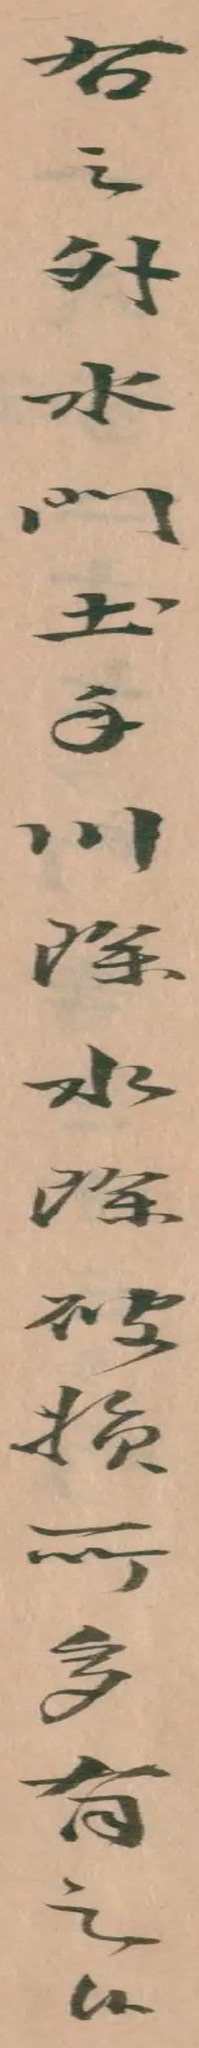右之外水門土手川除水除破損所多有之候
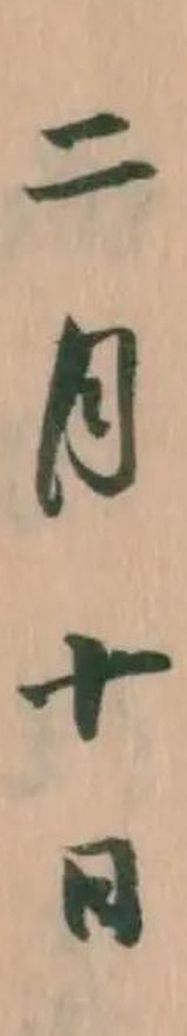二月十日
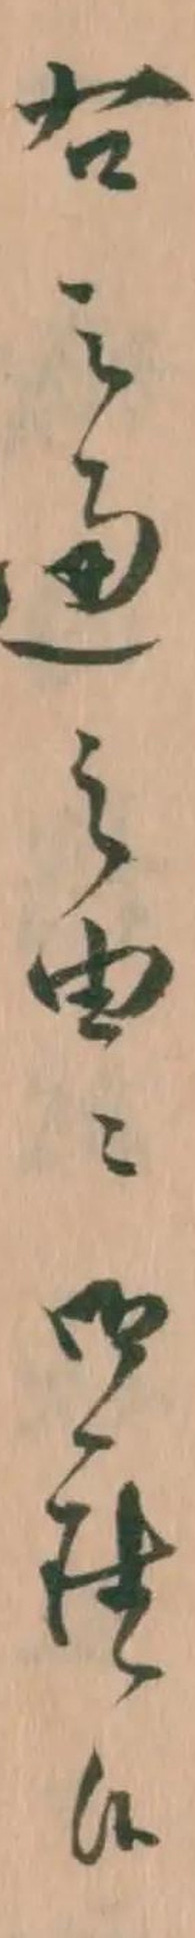右之通之由二御座候
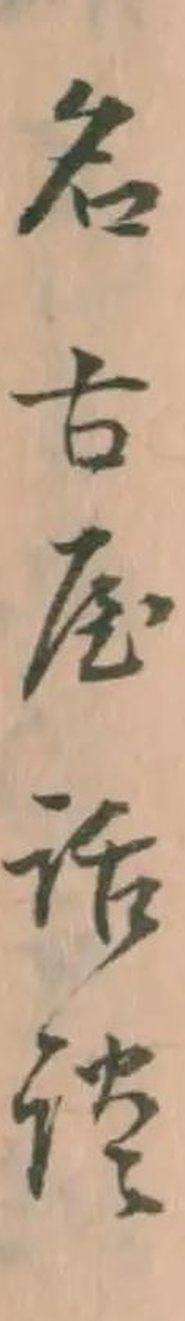名古屋話談
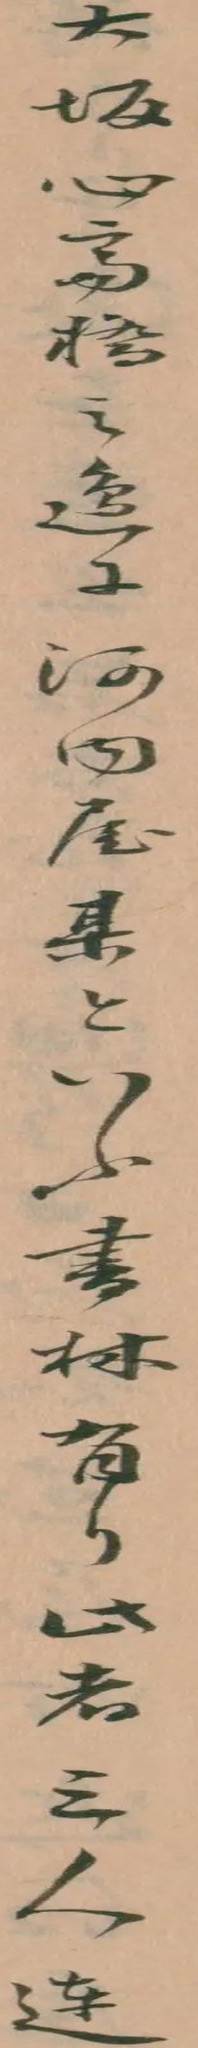大阪心斎橋の辺に河内屋某といふ書林有り此者三人連
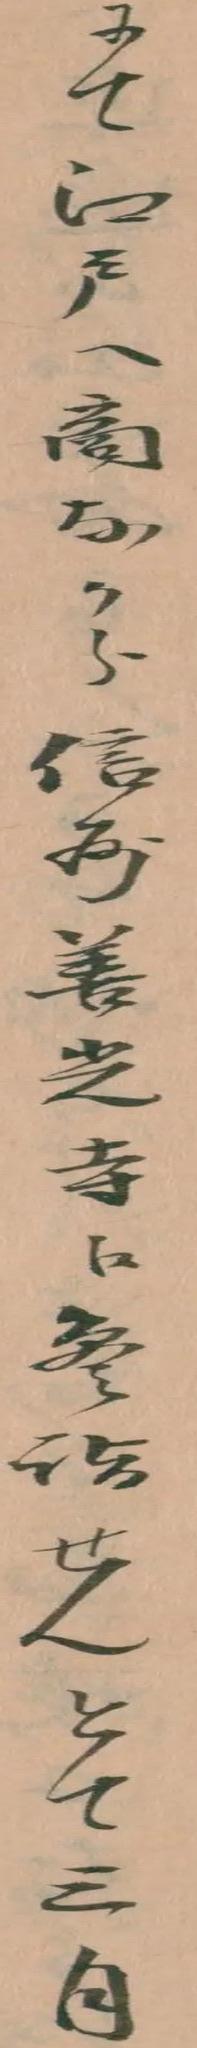にて江戸へ商なから信州善光寺へ参詣せんとて三月
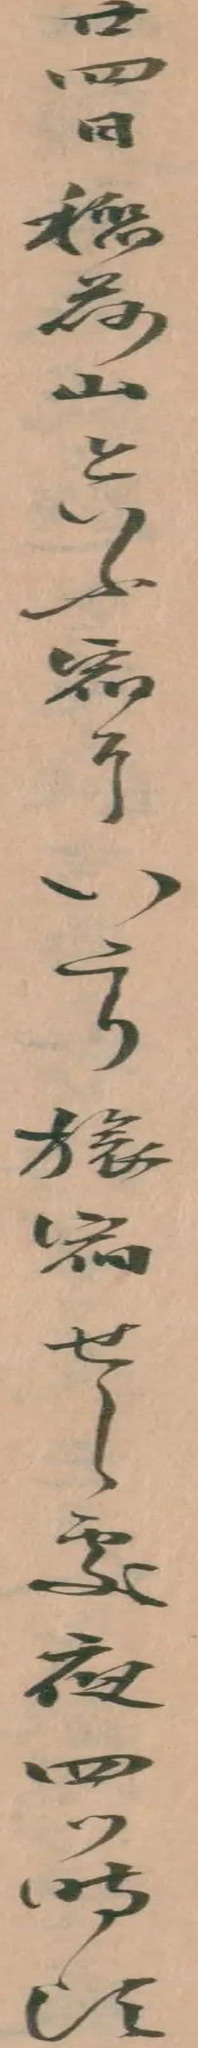廿四日稲荷山といふ宿にいたり旅宿せし処夜四ッ頃
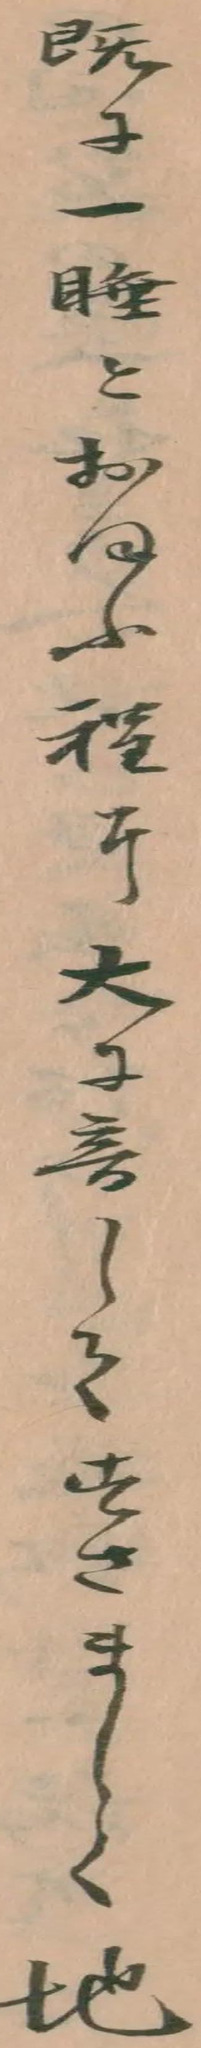既に一睡とおほふ程に大に音してすさましく地
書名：地災撮要. 巻3(地震之部)-巻4(噴火之部)
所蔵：国立国会図書館 National Diet Library, JAPAN
